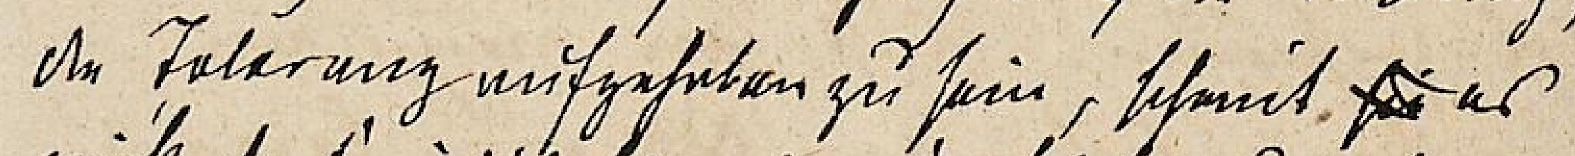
die Toleranz aufgehoben zu sein, scheint sie es
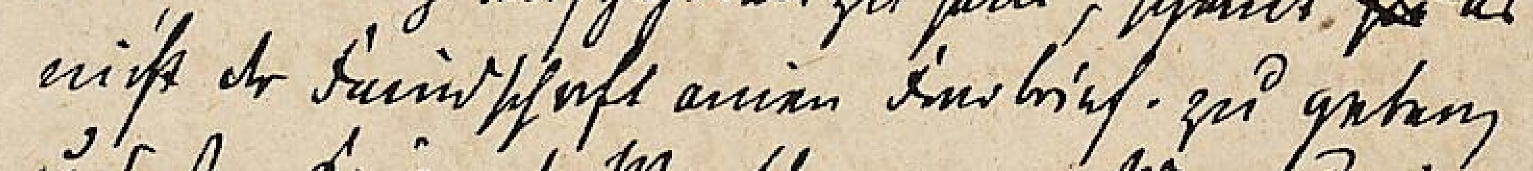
nicht dr Feindschaft einen Freibrief zu geben,
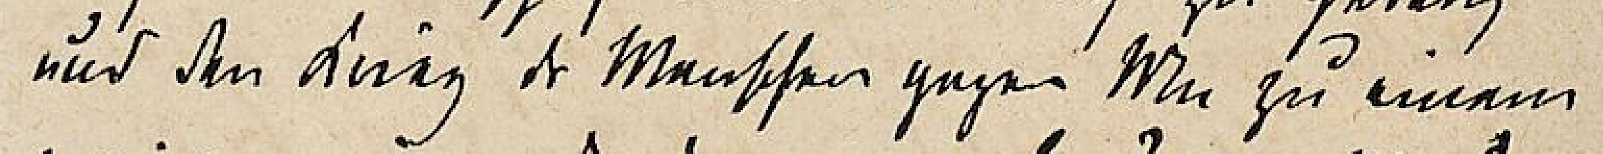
aus dm Krieg der Menschen gegen Mn zu einem
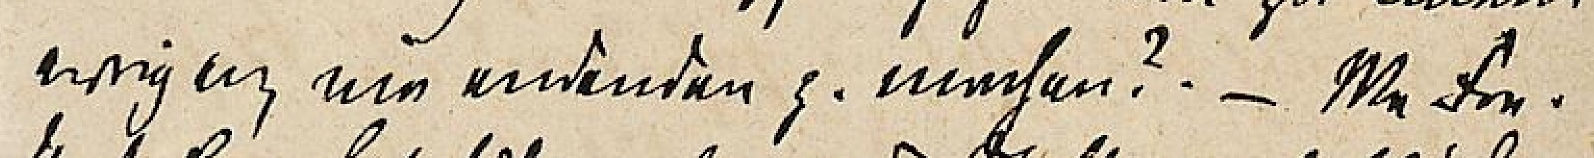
ewigen, nie endenden z. machen? _ Mn Frn.
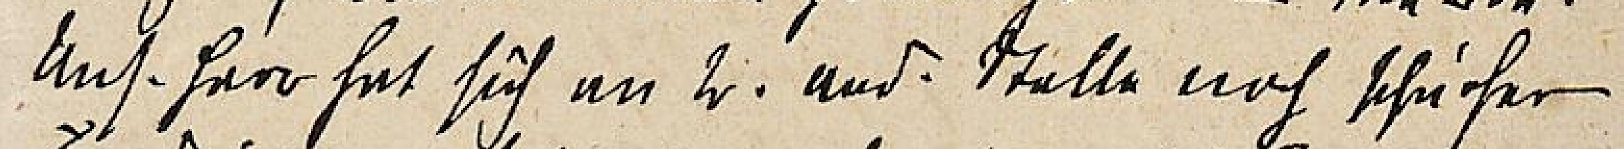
Uns. Herr hat sich an 2. and. Stellen noch schärfer
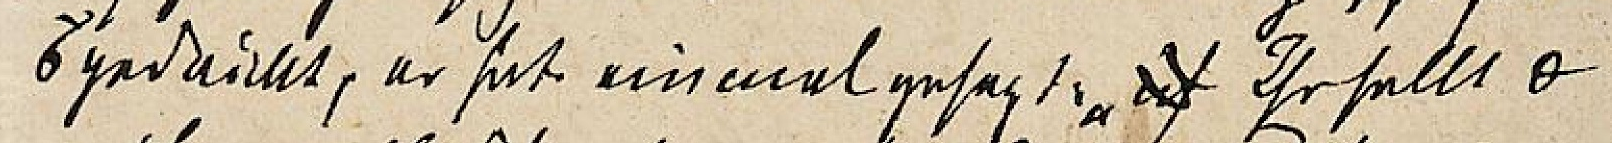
sgedrückt, er hat einmal gesagt: "ich Ihr sollt o
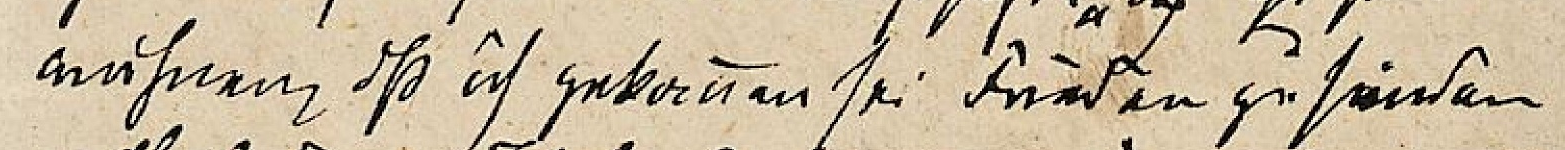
annehmen, dß ich gekomen sie Frieden zu senden
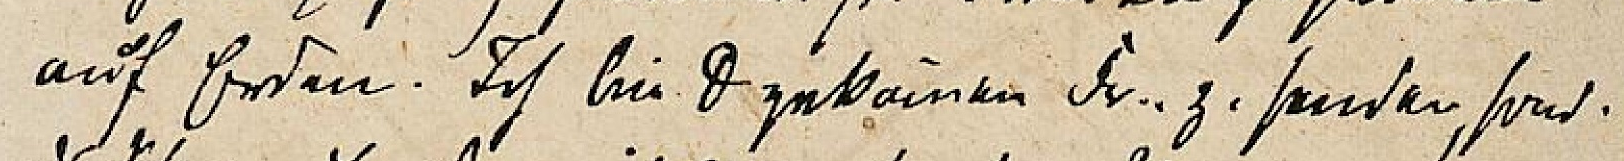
auf Erden. Ich bin o gekommen Fr. z. senden, sond.
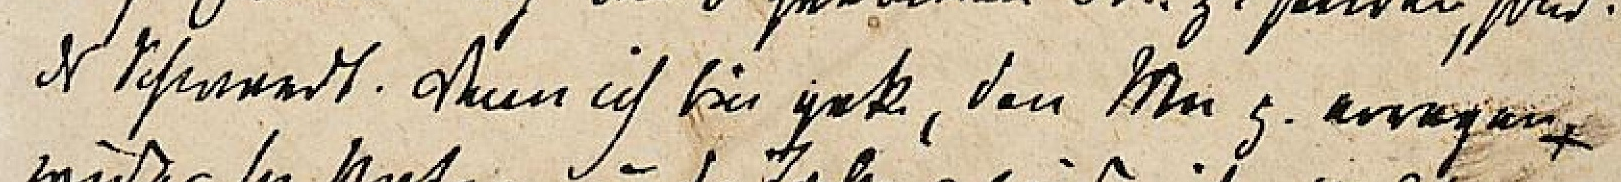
ds Schwert. Denn ich bin gek., den Mn z erregen
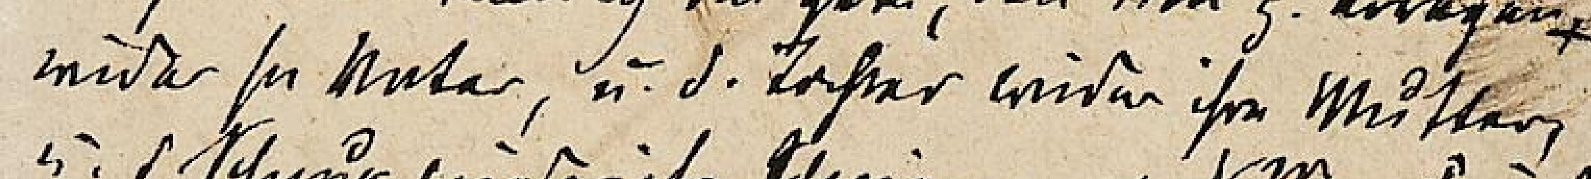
wider sn Vater u. d. Tochter wider ihre Mutter,
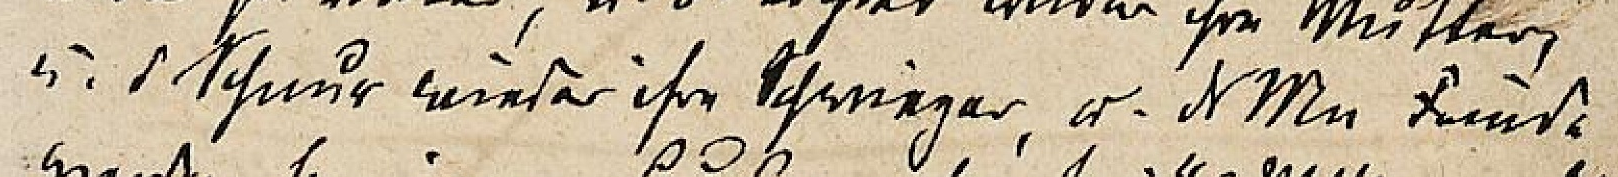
u. d. Schnur wieder ihre Schwieger, u. ds Mn Feinde
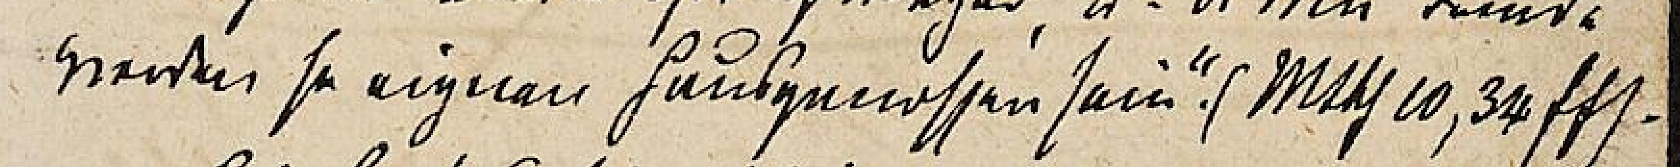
werden sn eignen Hausgenossen sein!. (Mtth 10, 34 ff).
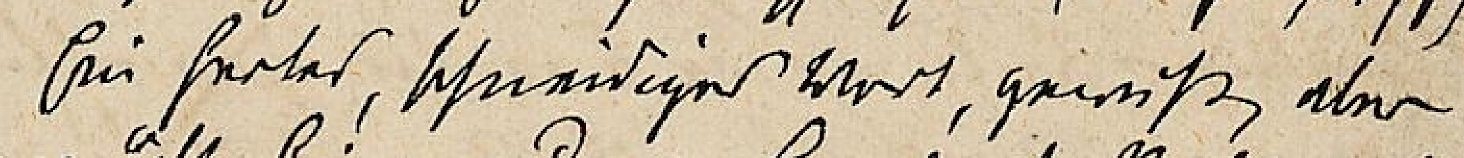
Ein hartes, schneidiges Wort, gewiß, aber
